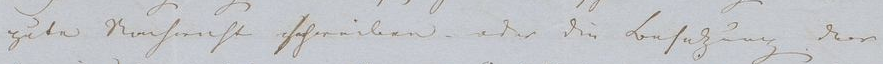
gute Nachricht schreiben – oder die Besetzung der
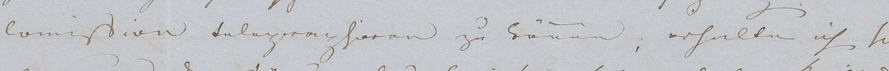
Comission telegraphiren zu können, erhalte ich so
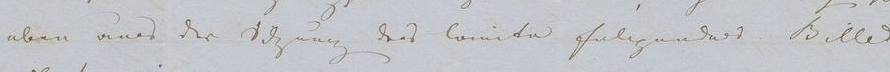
eben aus der Sitzung des Comite folgendes Billet
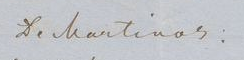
De Martinos:
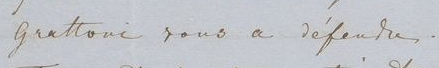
Grattoni nous a défendu.
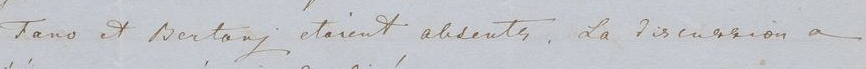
Fano et Bertanj etaient absents. La discussion a
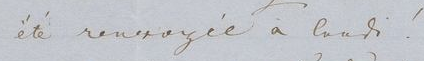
été renvoyée à lundi !»
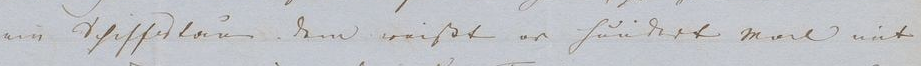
ein Schiffstau – dem reißt er hundert Mal mit
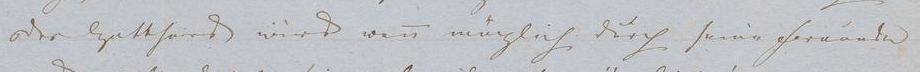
Der Gotthard wird wenn möglich durch seine Freunde
